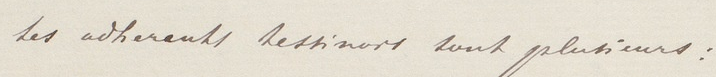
Les adherants tessinois sont plusieurs:
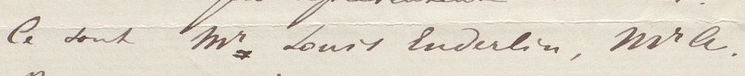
Ce sont MrLouis Enderlin, MrA.
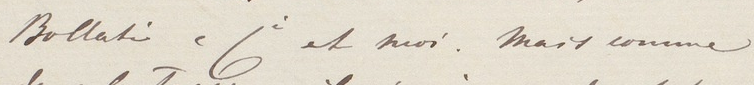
Bollati e Ci et moi. Mais comme
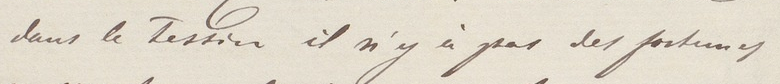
dans le Tessin il n'y à pas les fortunes
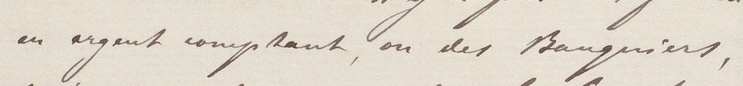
en argent comptant, ou des Banquiers,
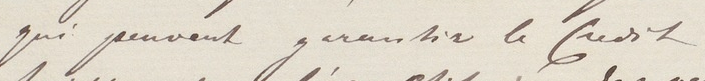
qui peuvent garantir le Credit
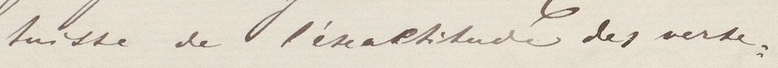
suisse de l'exatitude des verse-
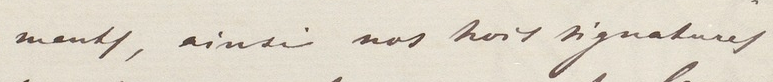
ments, ainsi nos trois signatures
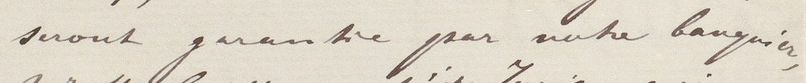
seront garantie par notre banquier,
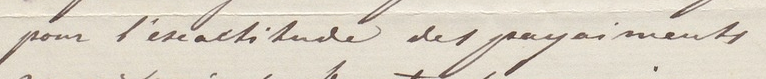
pour l'exactitude des payaiments
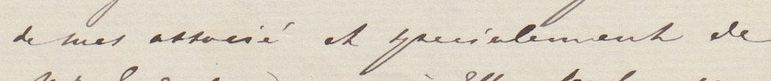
de mes associé et specialement de
